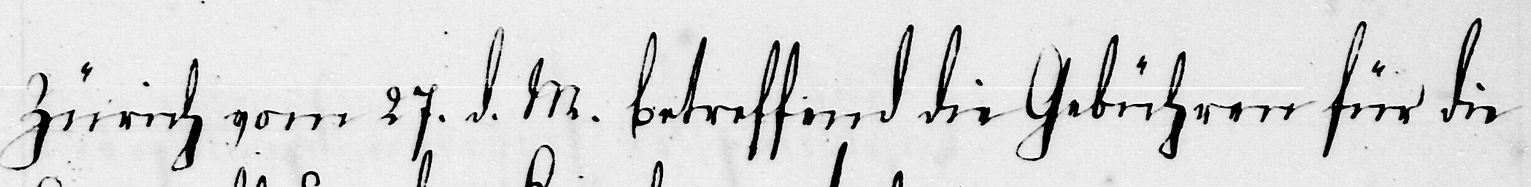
Zürich vom 27. d. M. betreffend die Gebühren für die
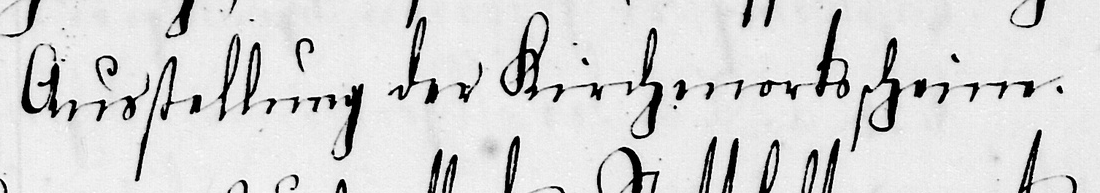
Ausstellung der Kirchenortsscheine.
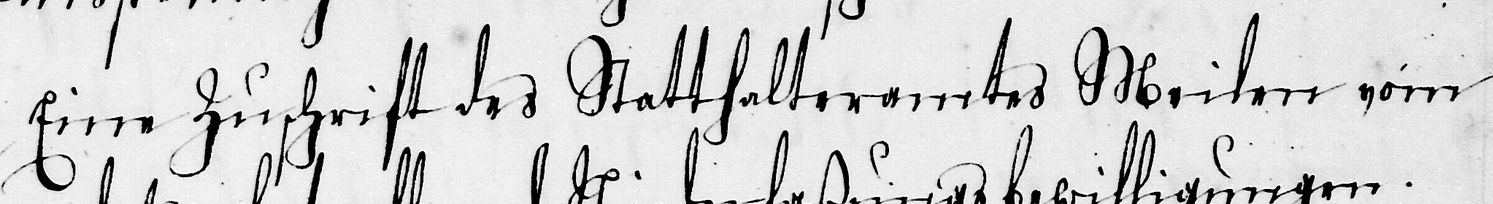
Eine Zuschrift des Statthalteramtes Meilen vom
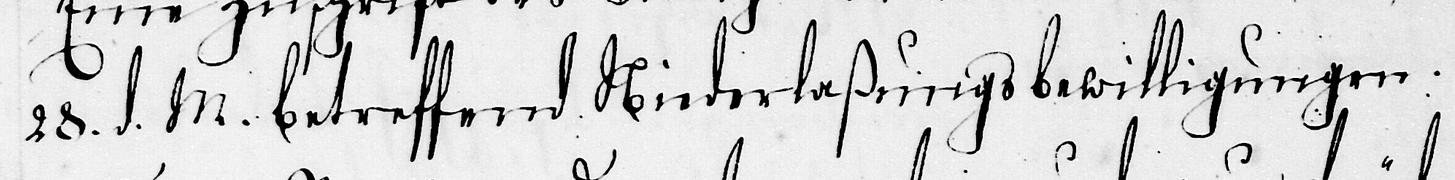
28. d. M. betreffend Niederlaßungsbewilligungen.
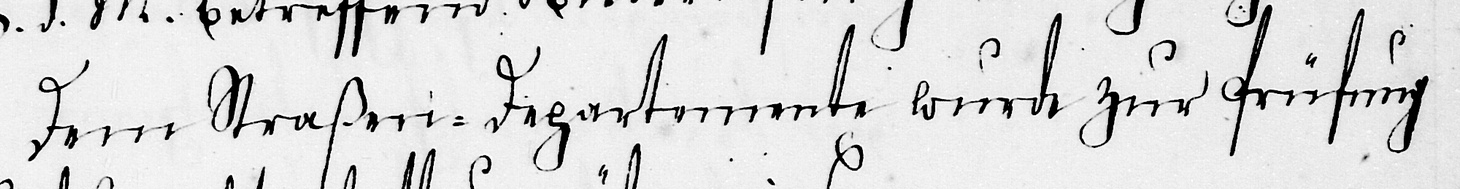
Dem Straßen-Departemente wurde zur Prüfung
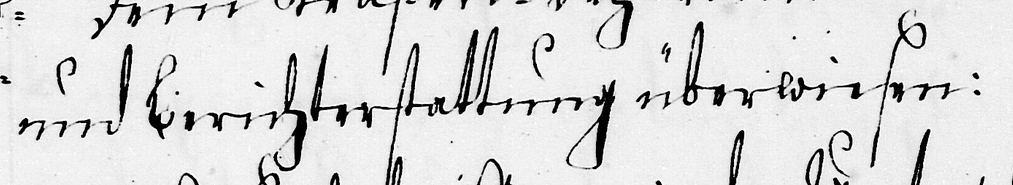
und Berichterstattung überwiesen:
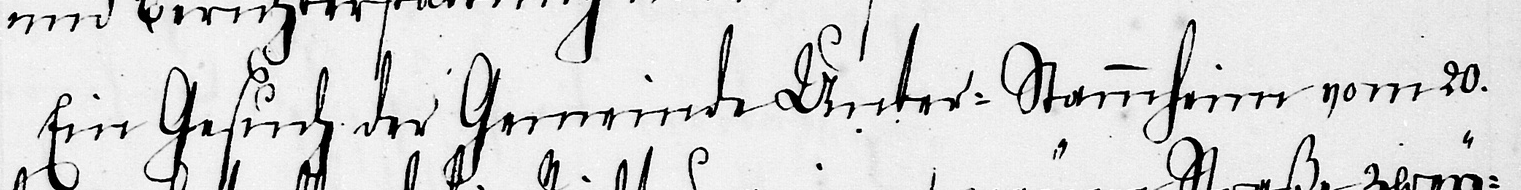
Ein Gesuch der Gemeinde Unter-Stammheim vom 20.
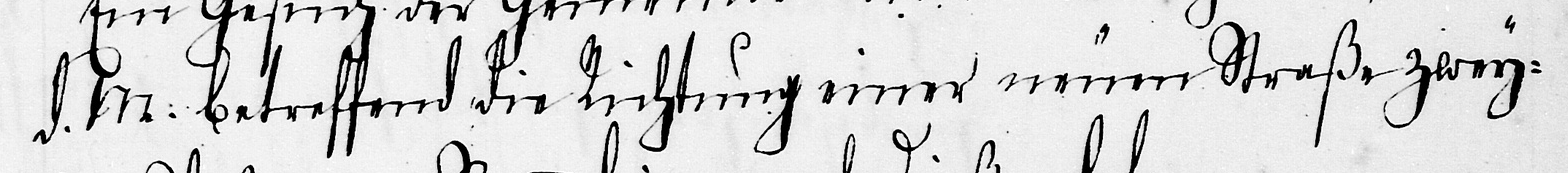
d. M. betreffend die Richtung einer neuen Straße zwey¬
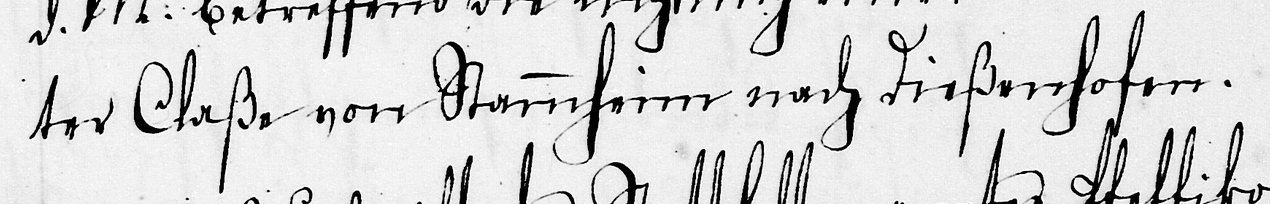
ter Claße von Stammheim nach Dießenhofen.
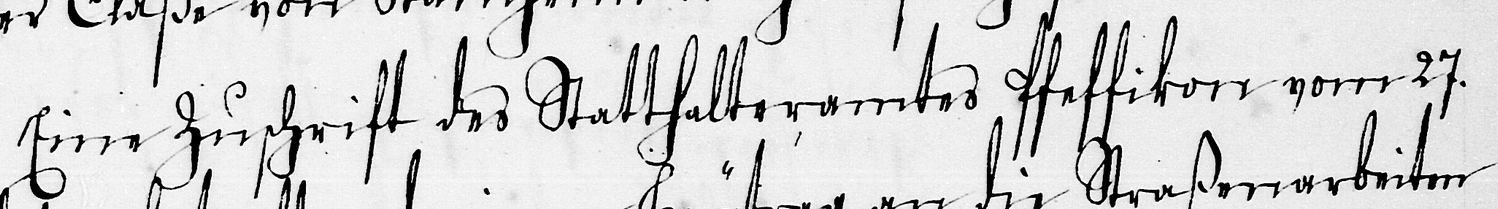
Eine Zuschrift des Statthalteramtes Pfeffikon vom 27.
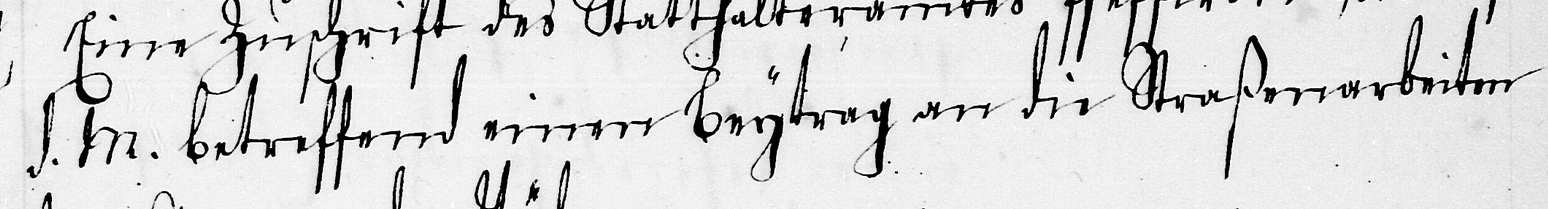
d. M. betreffend einen Beytrag an die Straßenarbeiten
